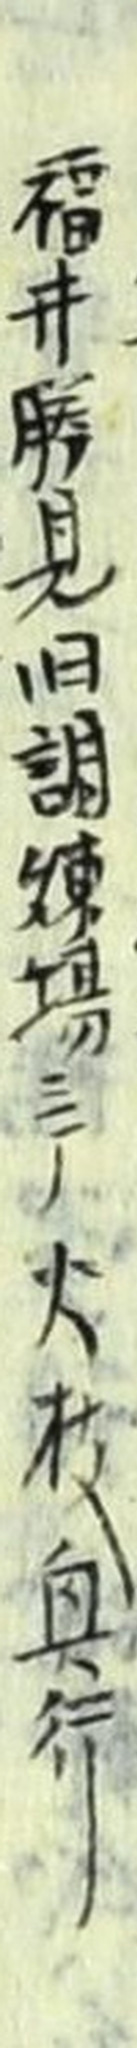福井勝見旧調煉場ニテ火枝興行
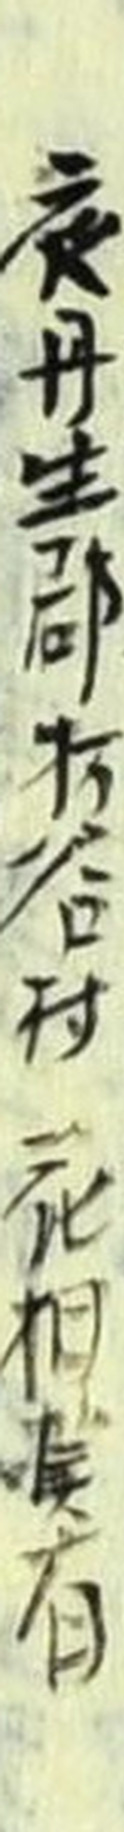夜丹生郡栃谷村花相撲有
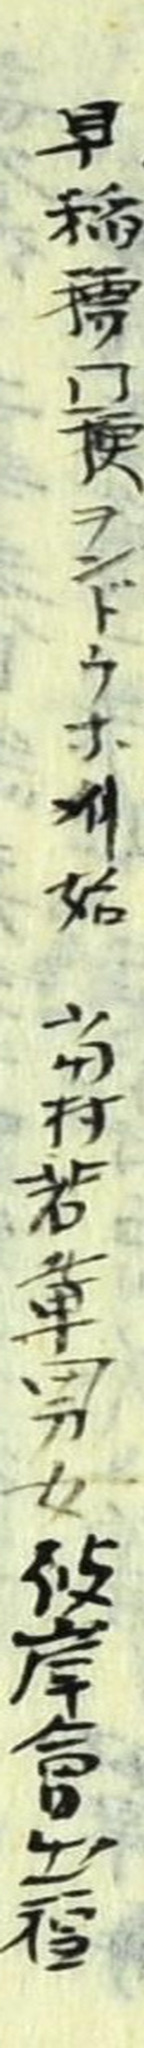早稲糯同稉ヲンドウ等刈始当村若輩男女彼岸会出福
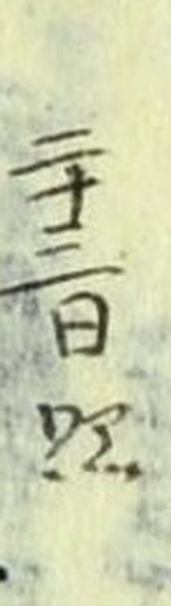二十三日照
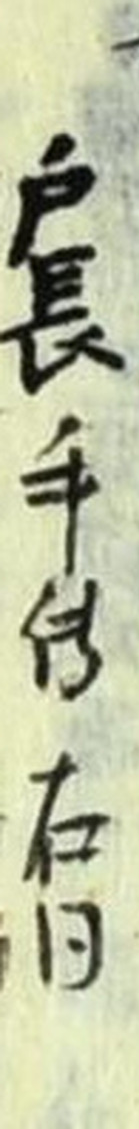戸長手伝右同
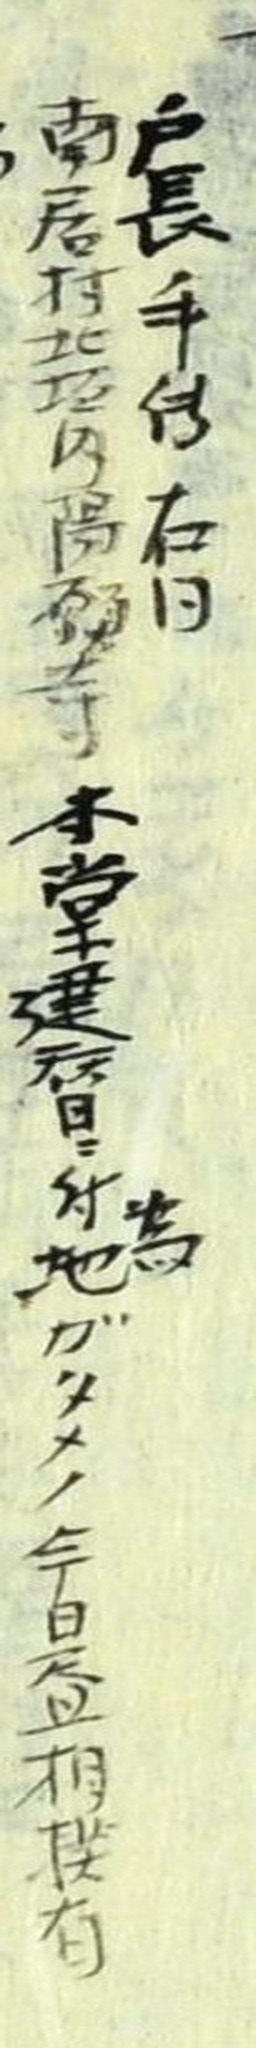南居村北垣内陽願寺本堂建替ニ付為地ガタメノ今日昼相撲有
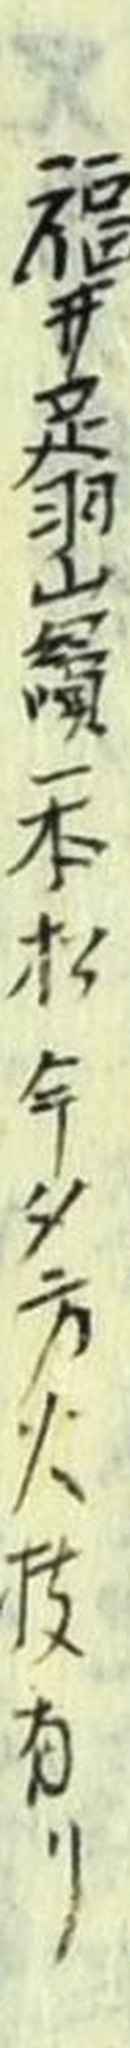福井足羽山続一本松今夕方火枝有リ
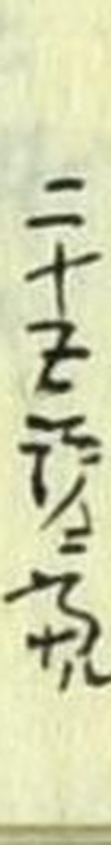二十五銭ニ当ル
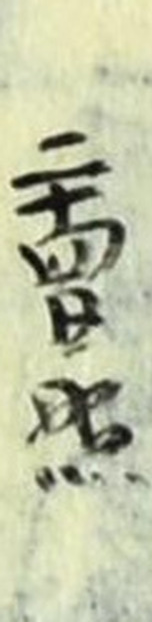二十四日照
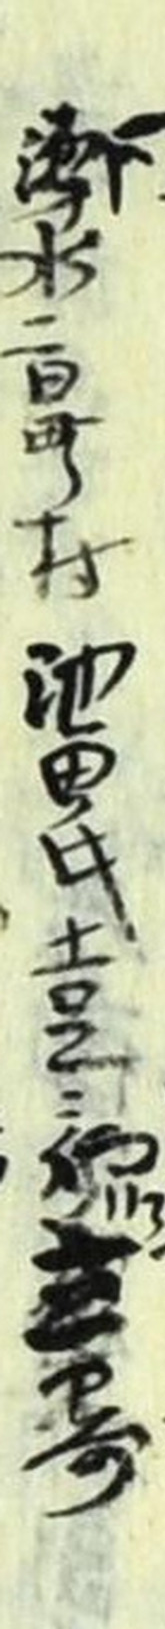浅水二日町村池田氏土足ニ潨立寄
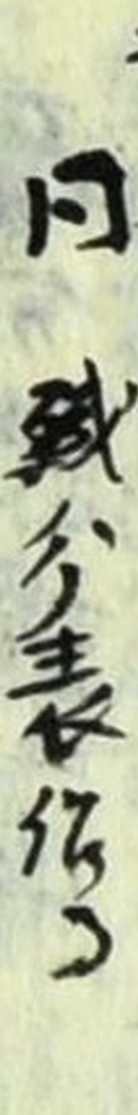同職分表作る
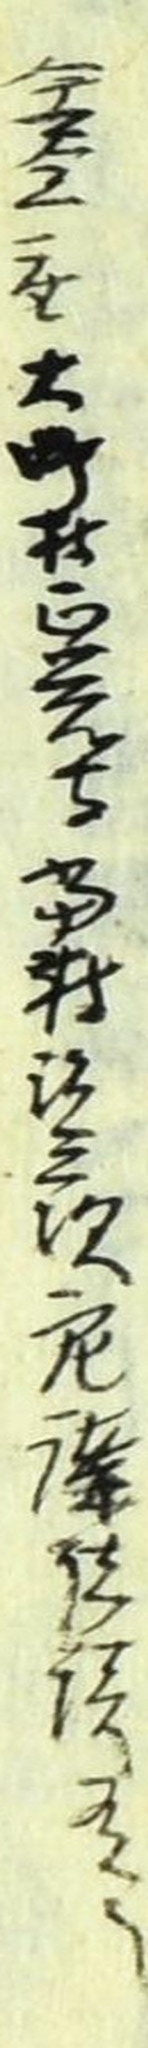今昼座大町村西光寺当村治三次へ尼講法談有之

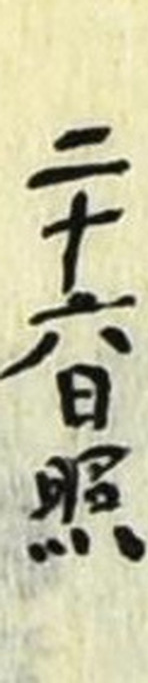二十六日照
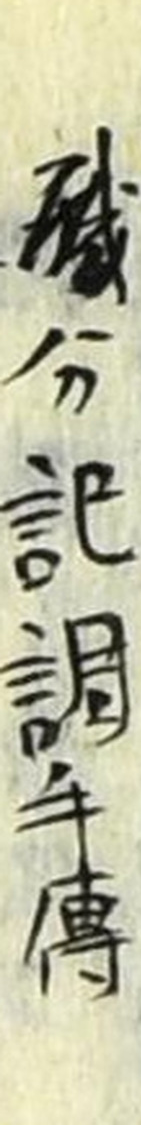職分記調手伝
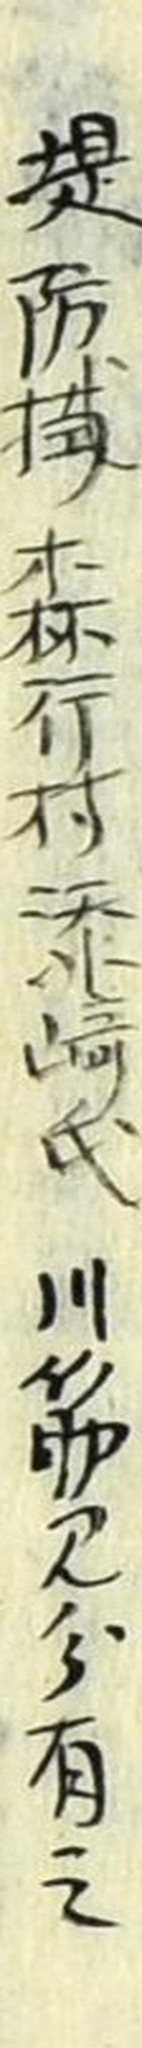堤防掛森行村漆崎氏川筋見分有之
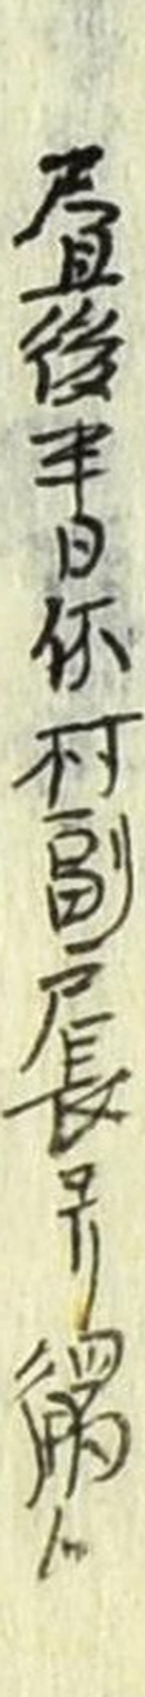同昼後半日休村副戸長ヨリ触候
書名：（日記）
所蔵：福井県文書館 Fukui Prefectural Archives
